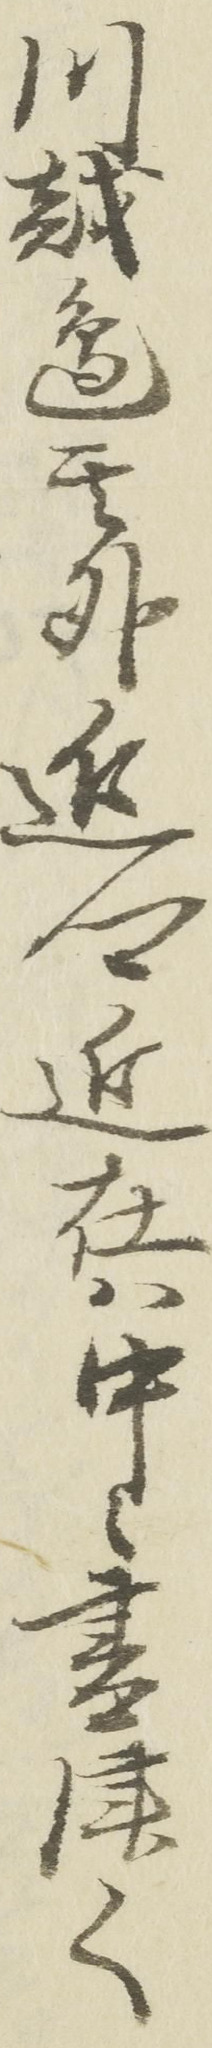川越辺其外近郷近在ハ中〻書つく
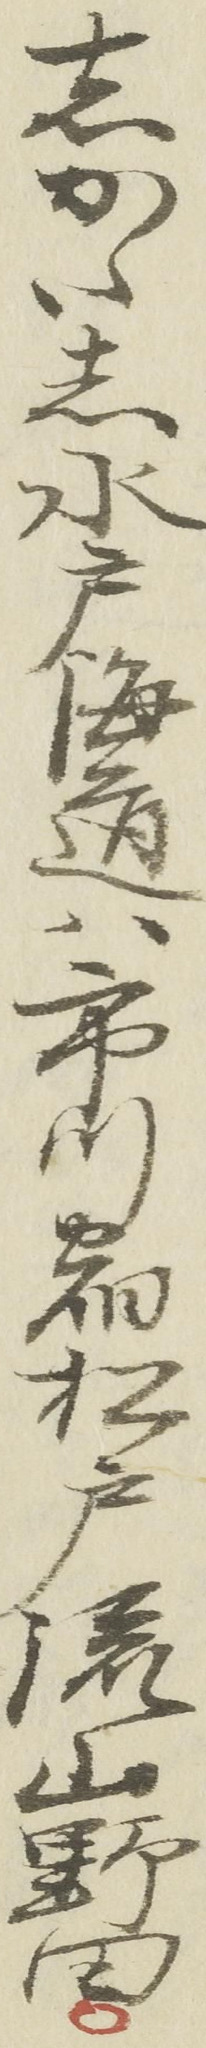しかたし水戸海道ハ市川宿松戸流山野田
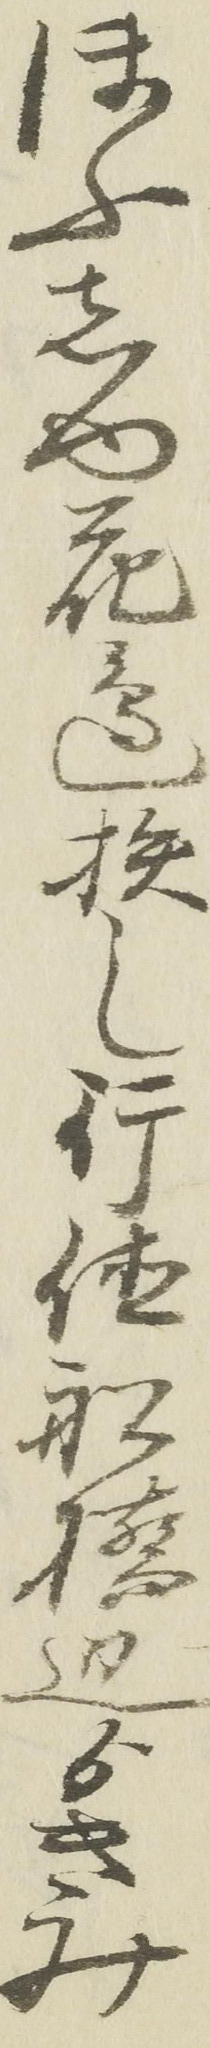ほふしゆ花辺損し行徳船橋辺ゟきみ
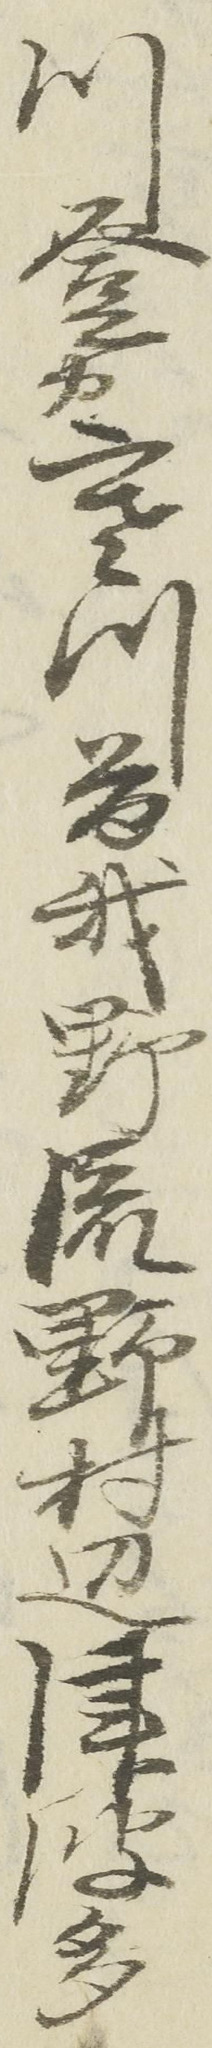川登カ寒川曽我野流野村辺津波多
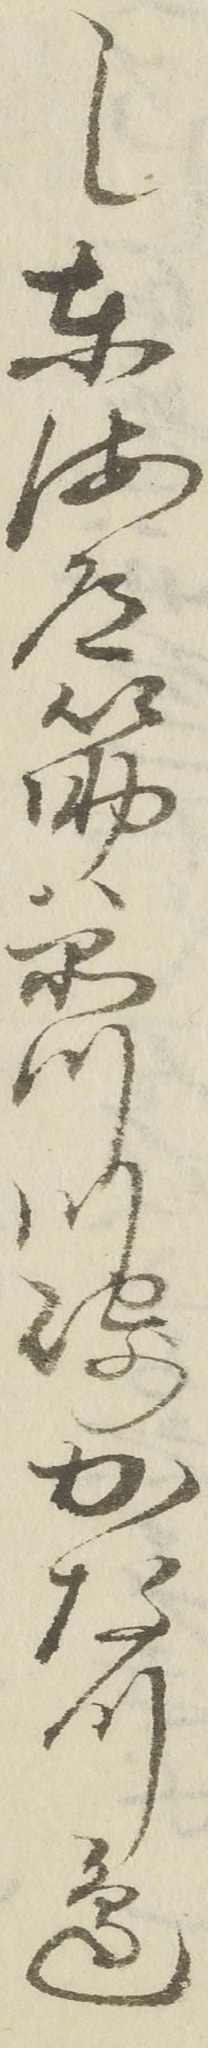し東海道筋ハ品川川崎かな川辺
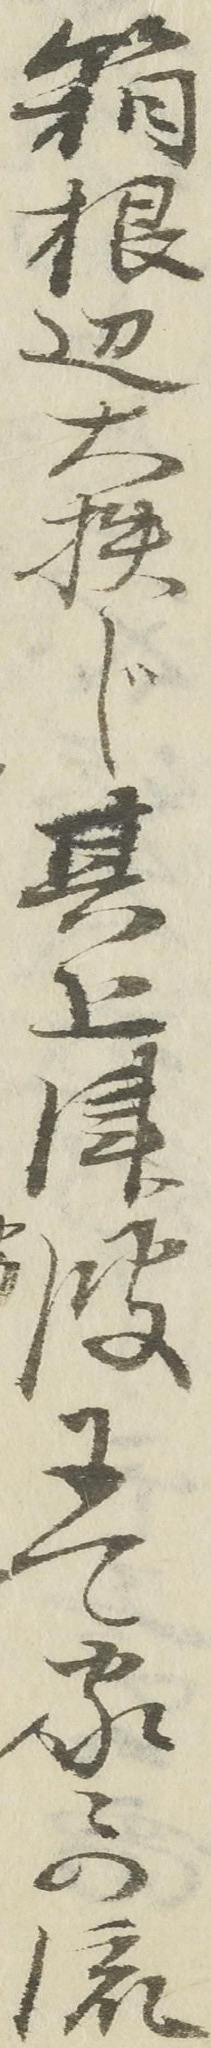箱根辺大損じ其上津波にて家〻の流
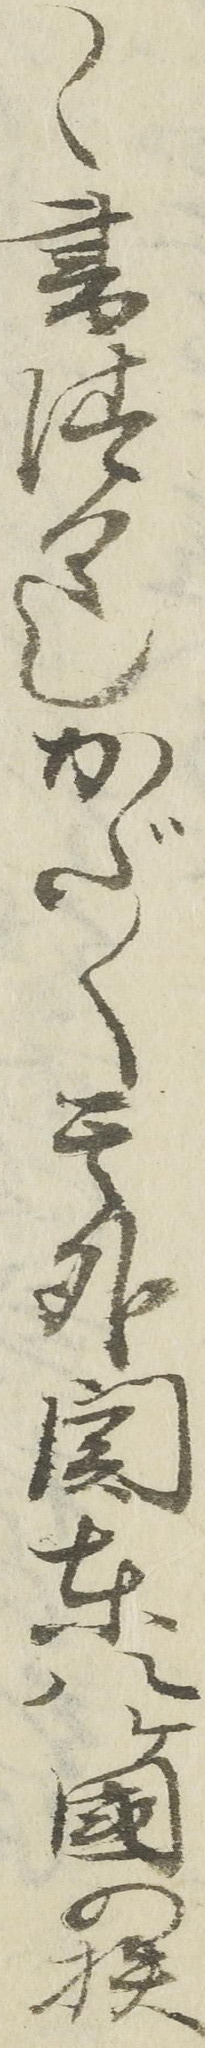〻書つくしかだく其外関東八ケ国の損
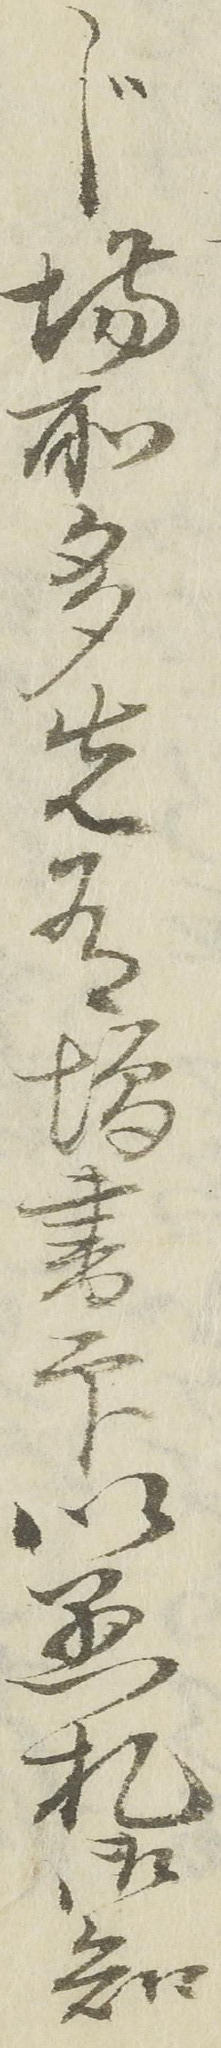じ場所多先有増書印以愚札御知
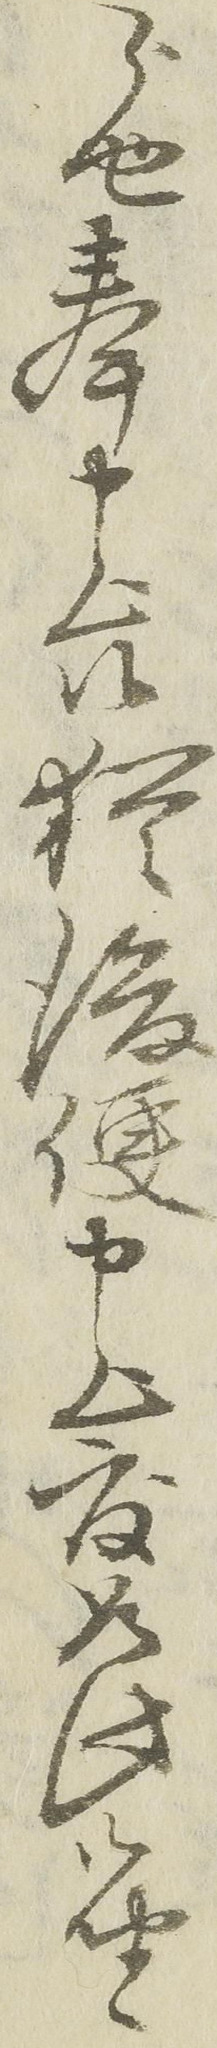らせ奉申上候猶後便申上度如此御坐候
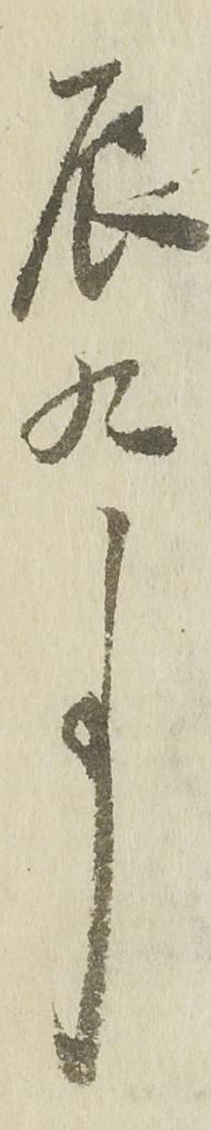辰九月

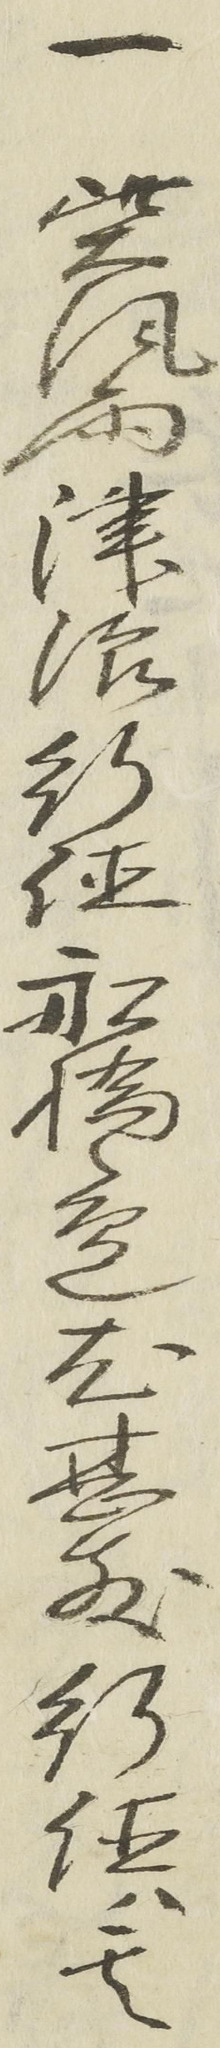一此大風雨津浪行徳舩橋辺尤甚敷行徳は其
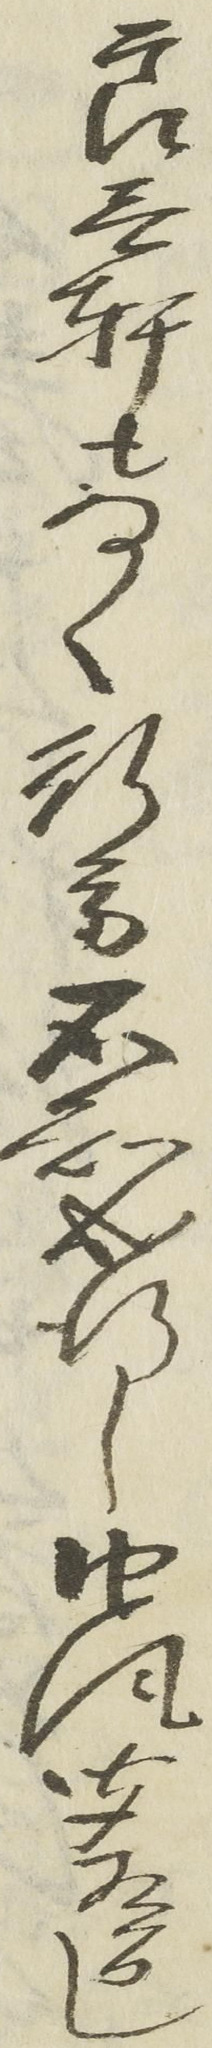節壱軒もなく行方不知成得し由風聞有りし
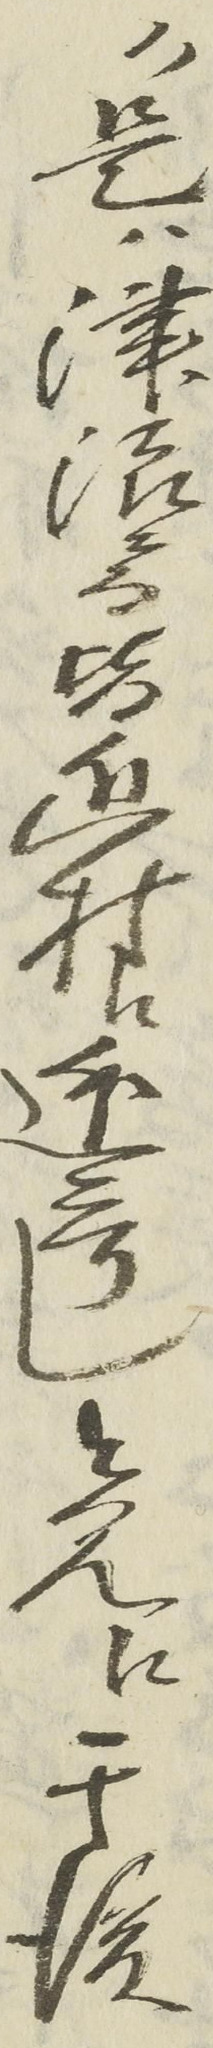か是は津浪に而皆近村江迯去りしと見江其後
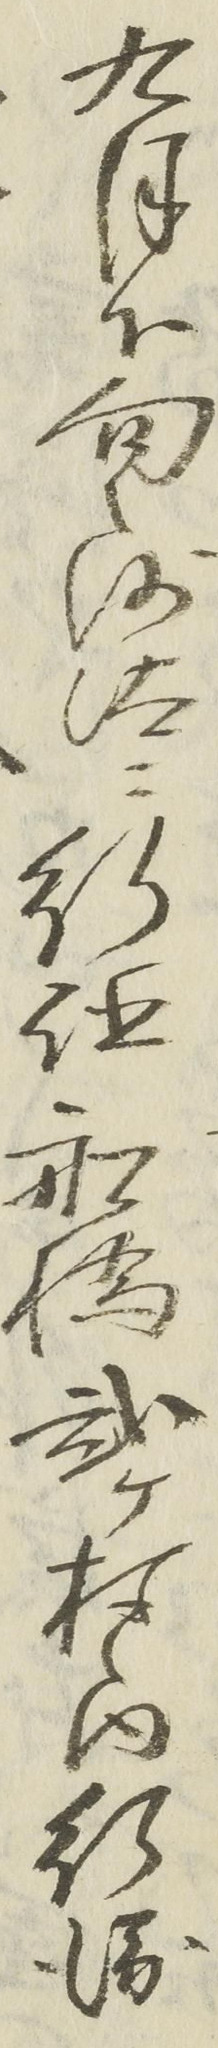九月下旬之沙汰に行徳舩橋弐ケ村之内行衛
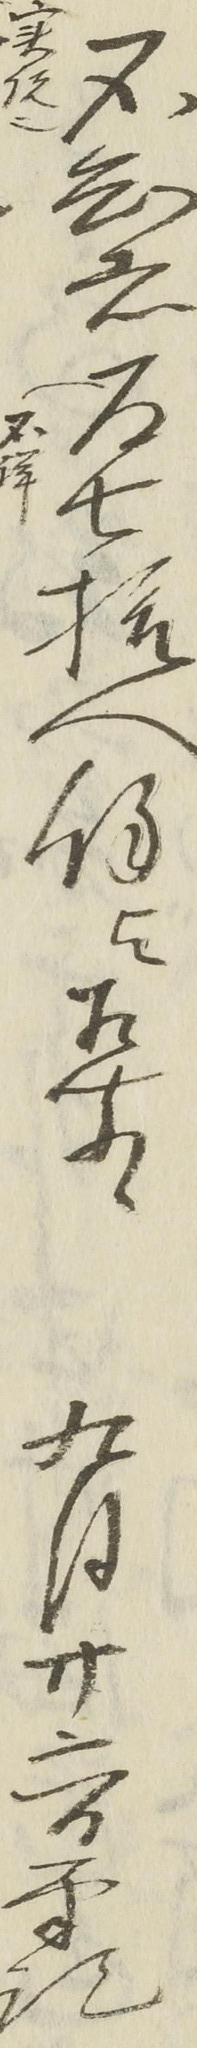不知之者百七拾人余と相聞候九月廿六日筆記
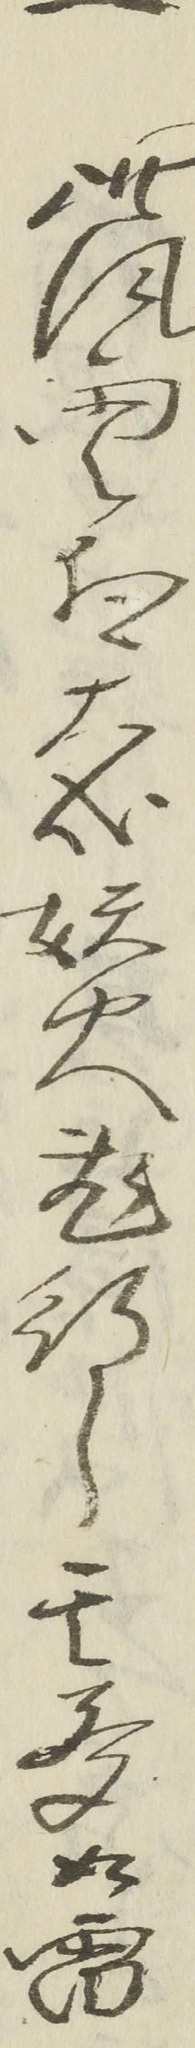一此風雨之夜大成妖火飛行し其聲如雷
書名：安政乙卯江戸大地震筆記　安政丙辰八月大阪大雷雨之記追加　安政三辰年七月松前辺大地震并八月大風雨記録
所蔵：東京大学地震研究所図書室 Earthquake Research Institute Library, The University of Tokyo, JAPAN
